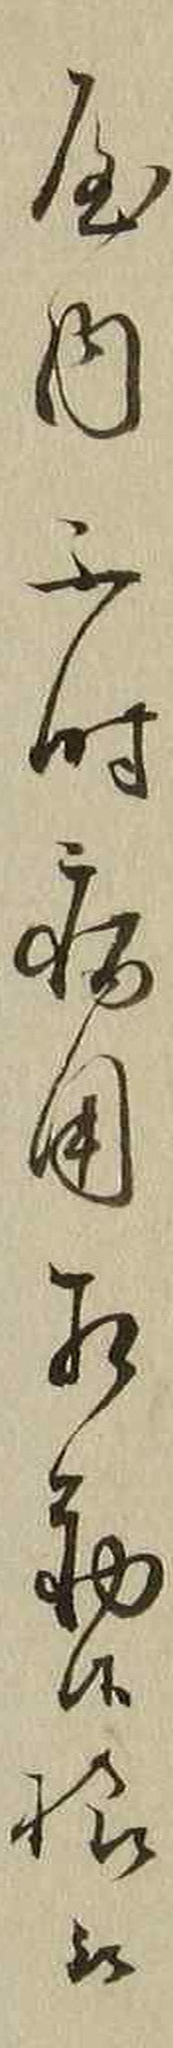屋内不時病用相勤候様被
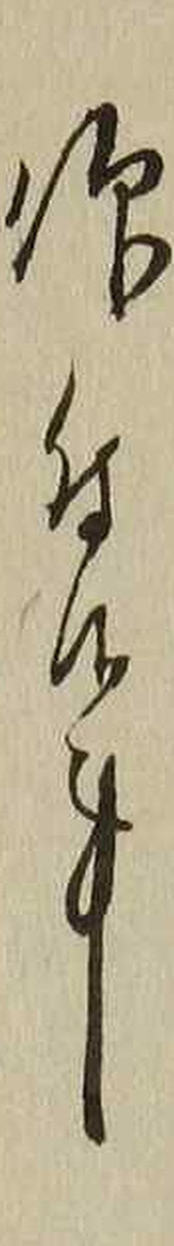仰付候事
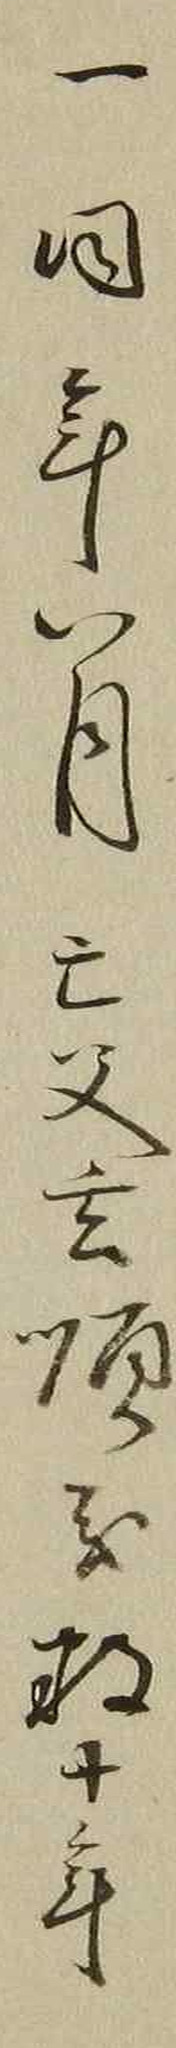一同年八月亡父玄順義数十年
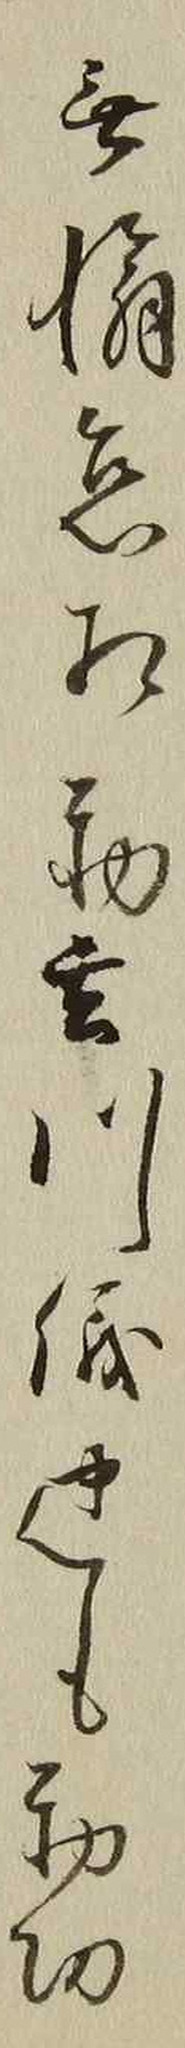無懈怠相勤玄川儀迚も勤切
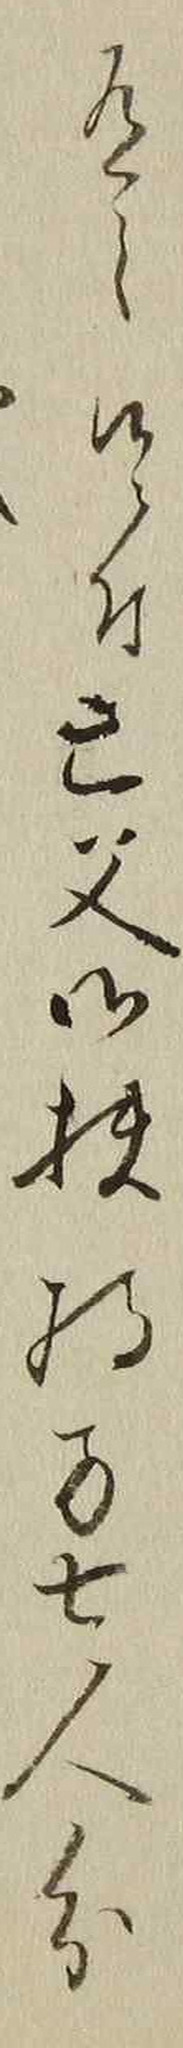有之候ニ付亡父御扶持方七人分
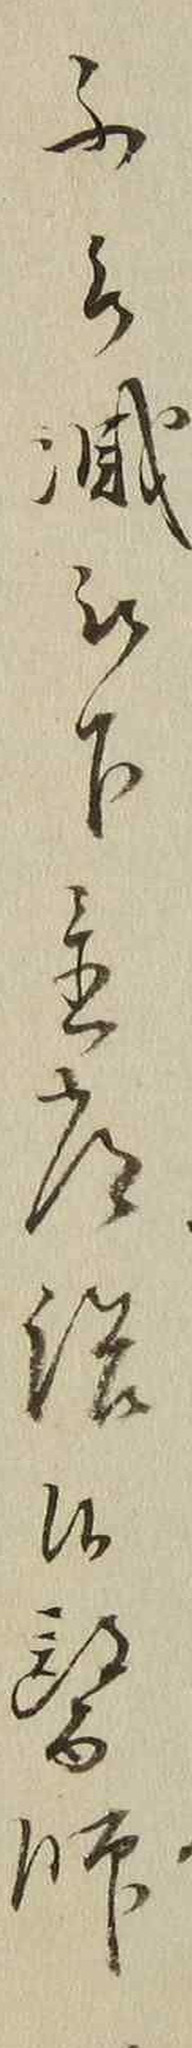不被減被下置常詰候医師ニ
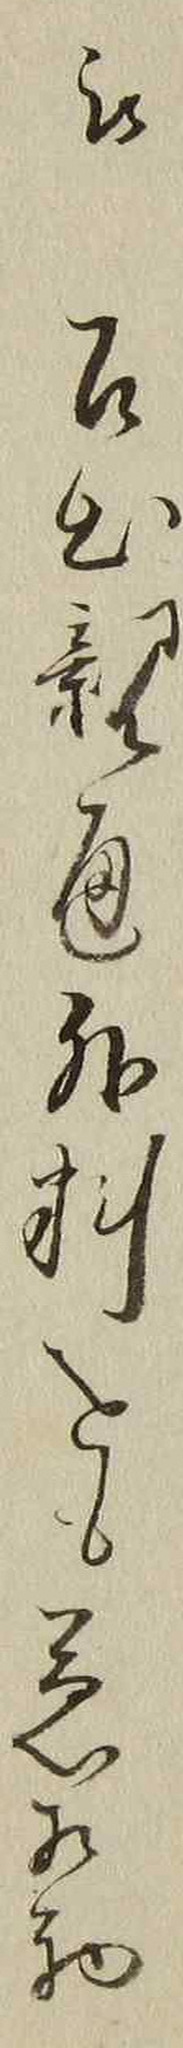被召出親通外料とも兼相勤
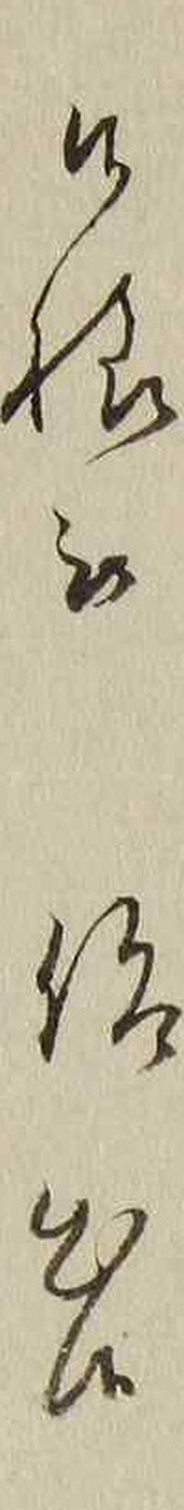候様被仰出候
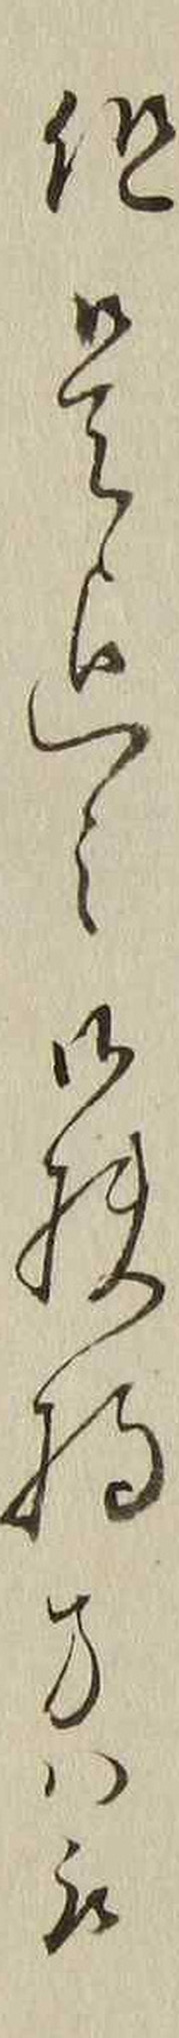但是迄之御扶持方ハ被
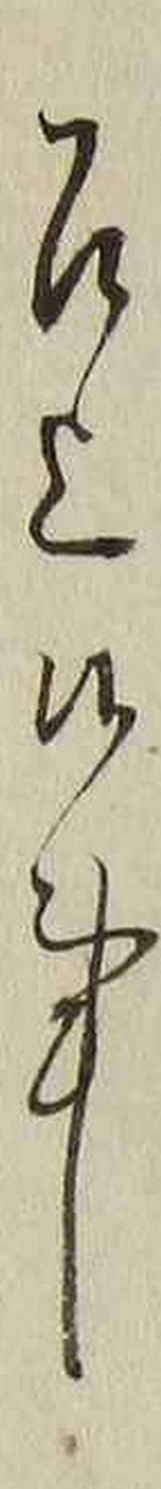召上候事
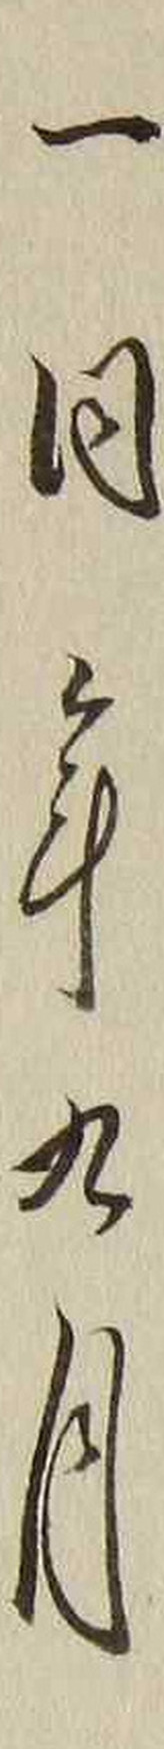一同年九月
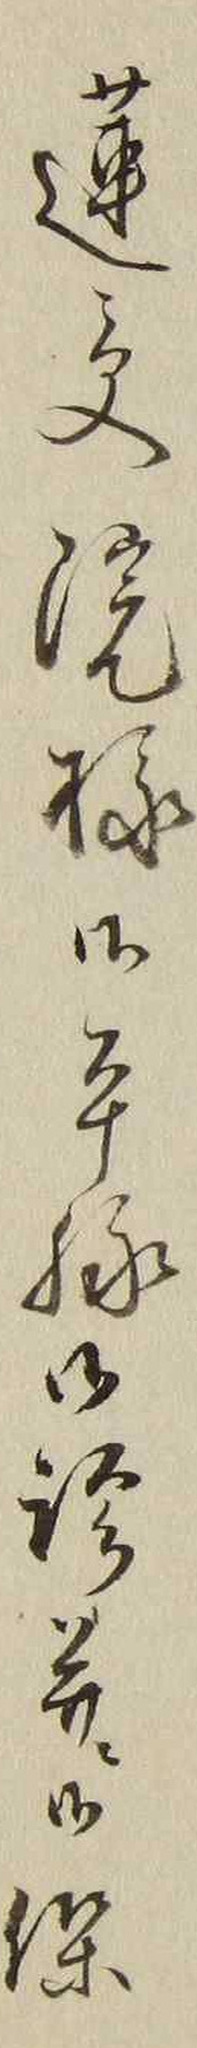蓮受院様御平様御診幷ニ御保
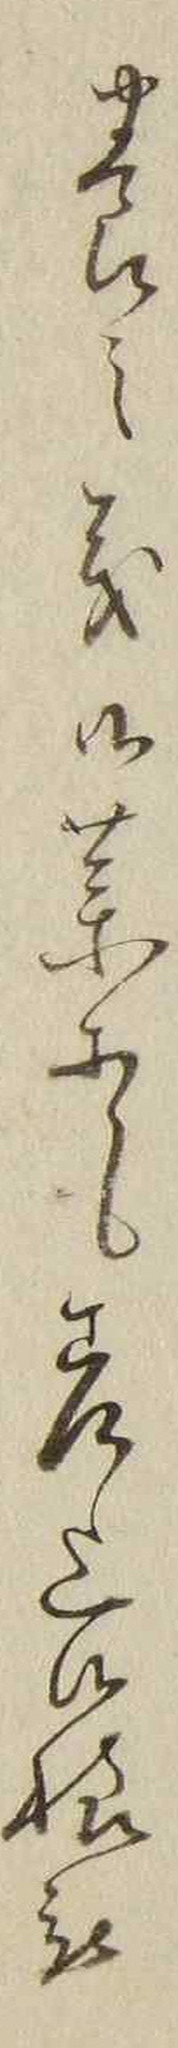養之義御薬等も差上候様被

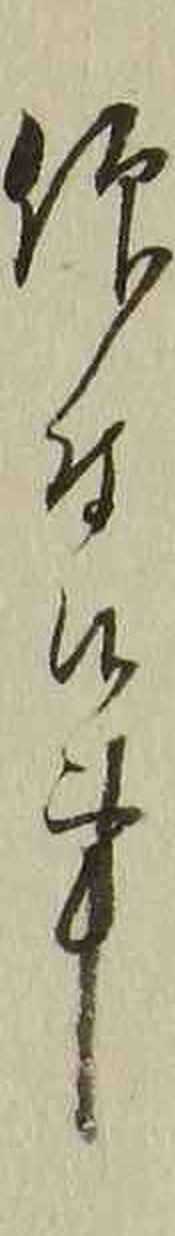仰付候事
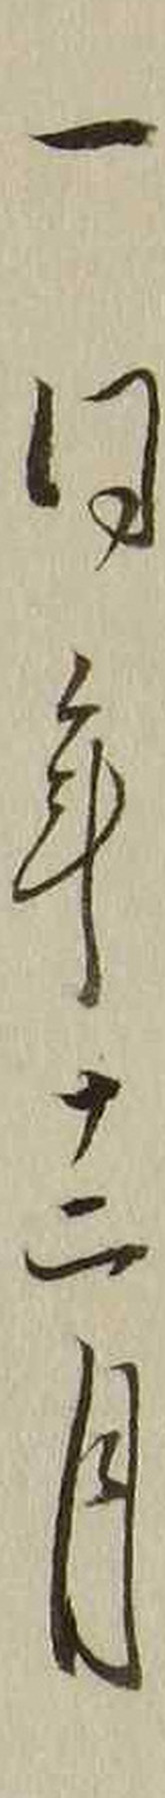一同年十二月
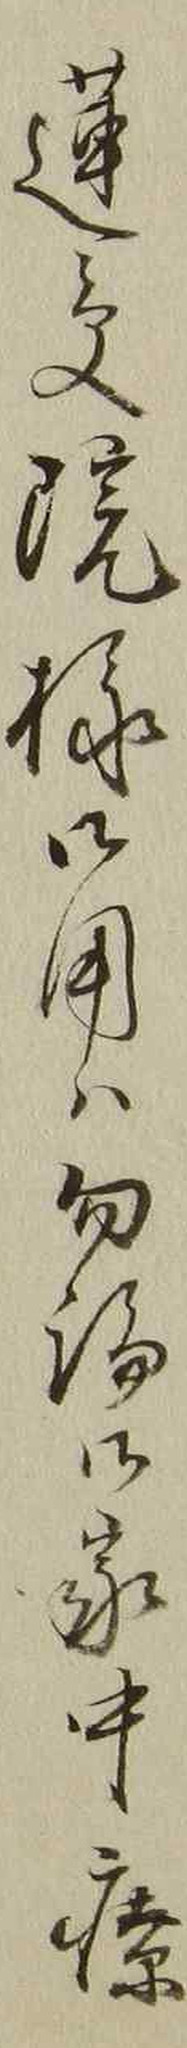蓮受院様御用ハ勿論御家中療
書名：諸士系譜　巻之129　た之部5
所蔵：会津若松市立会津図書館
